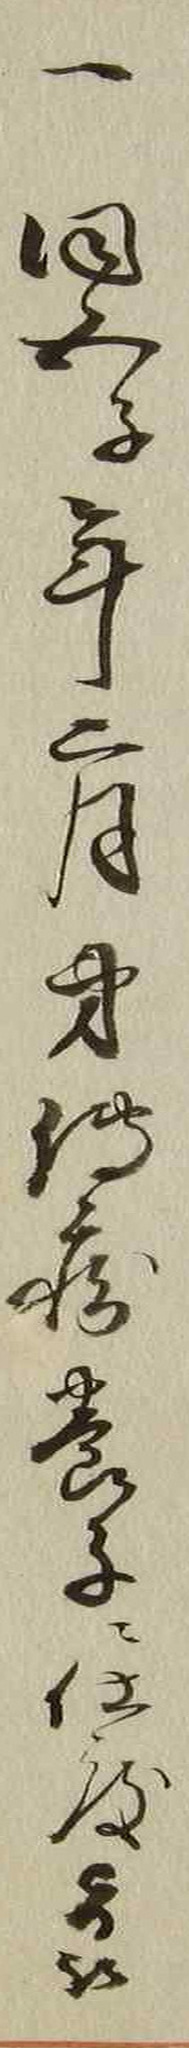一同五子年二月弟伝蔵養子ニ仕度旨被
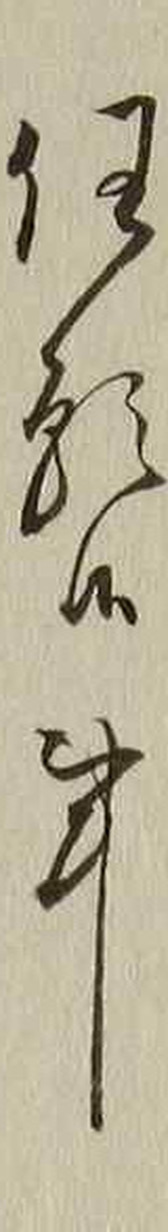任願候事
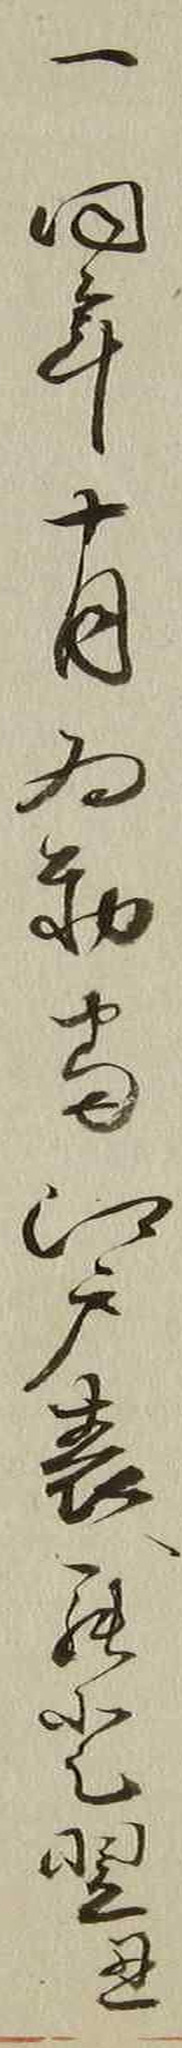一同年十月為勤番江戸表へ罷登翌丑
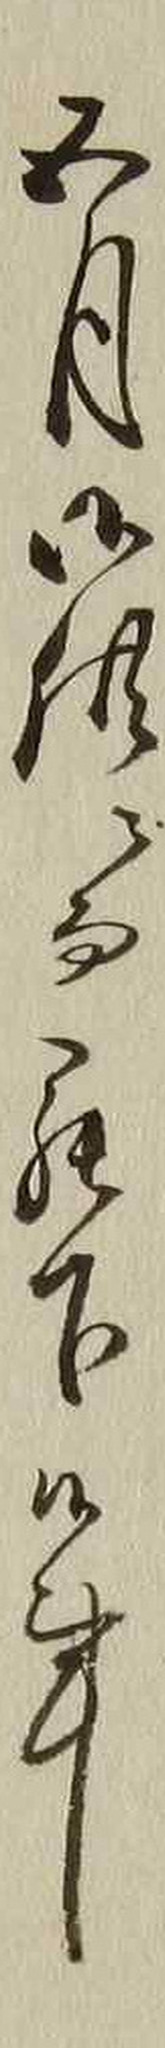五月御供ニ而罷下候事
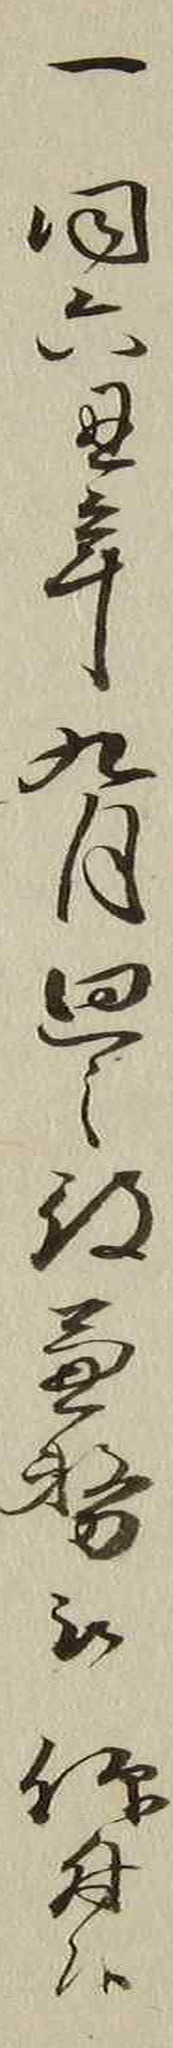一同六丑年九月廻之役兼務被仰付候
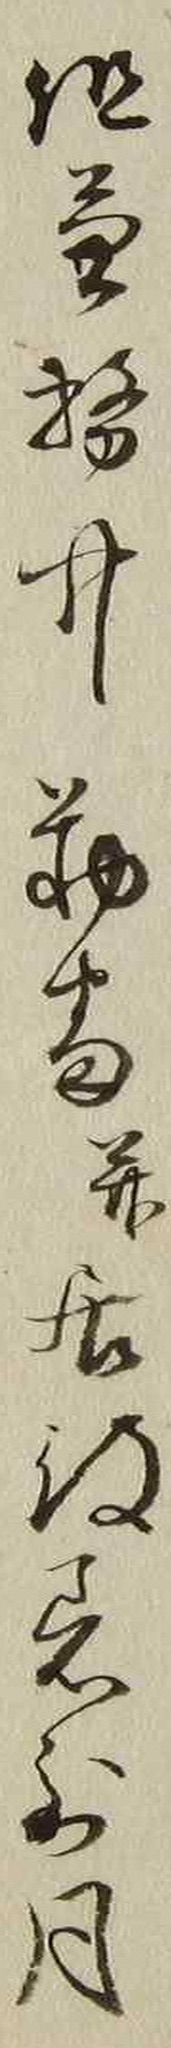但兼務中勤番并居役着前月
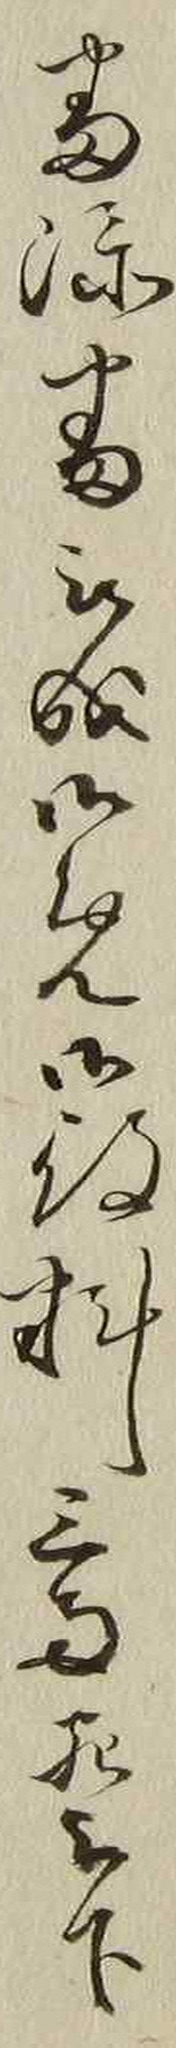番添番被成御免御役料三両宛被下
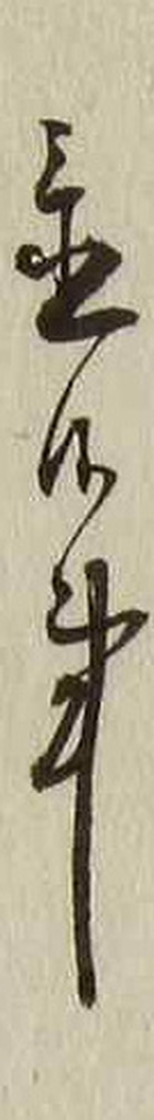置候事
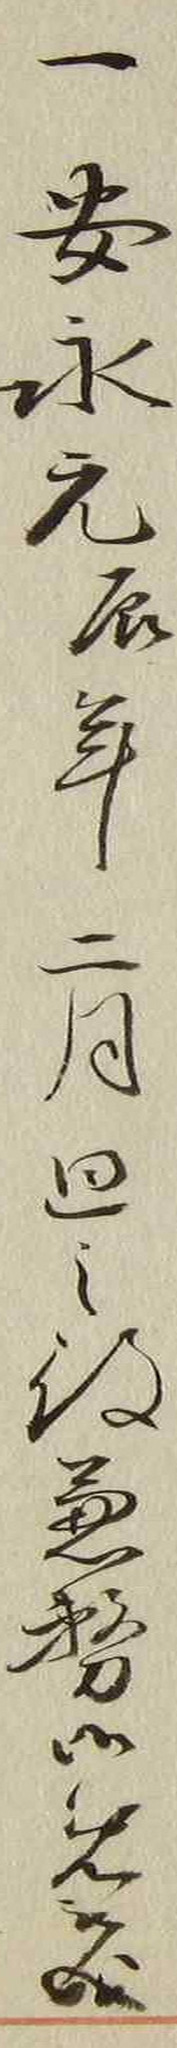一安永元辰年二月廻之役兼務御免被成
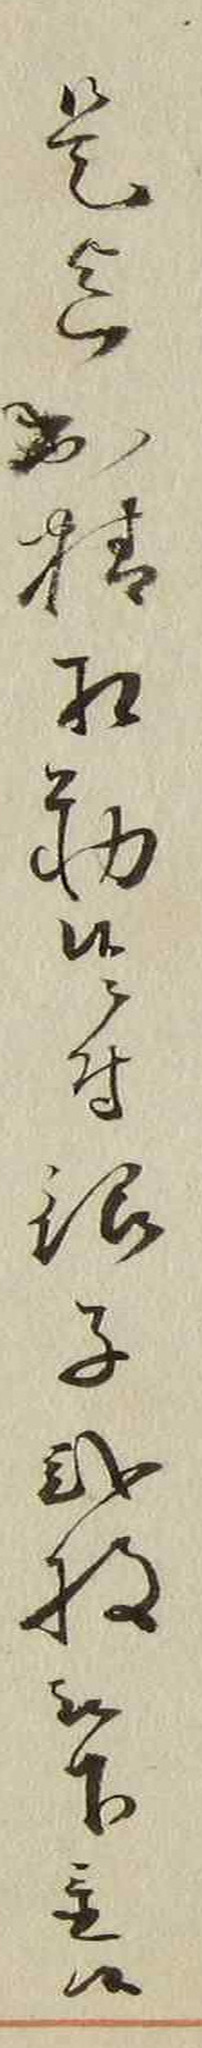是迄出精相勤候ニ付銀子弐枚被下置候
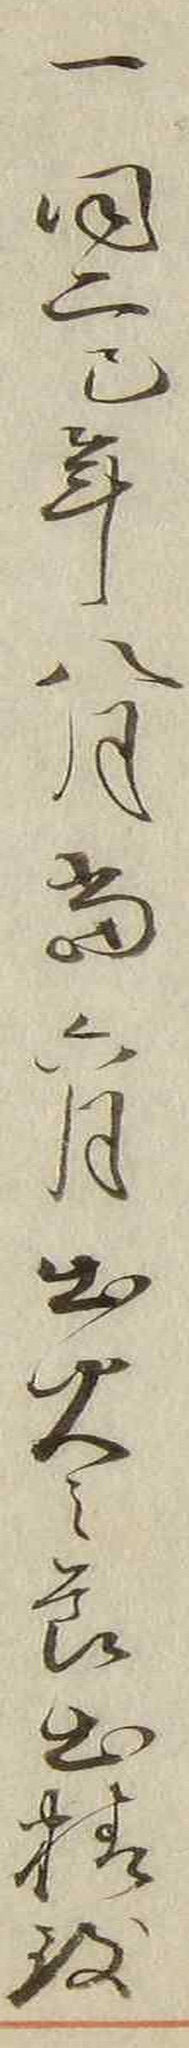一同二巳年八月当六月出火之節出精致
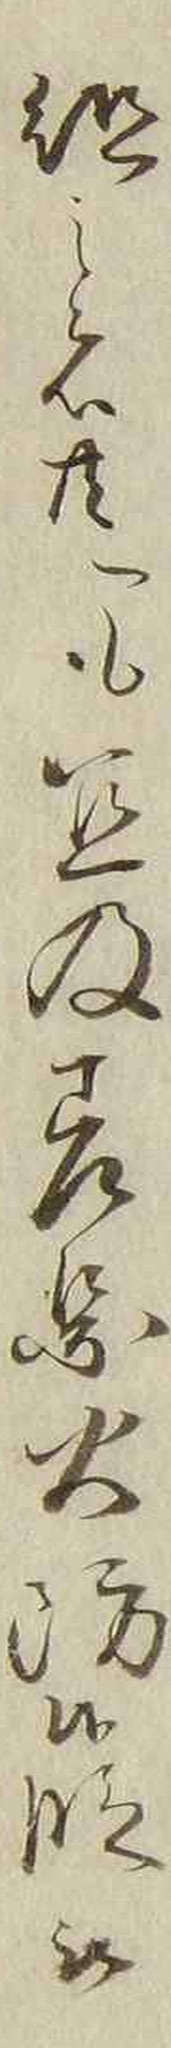組之者共へも宜及差図火防候段被

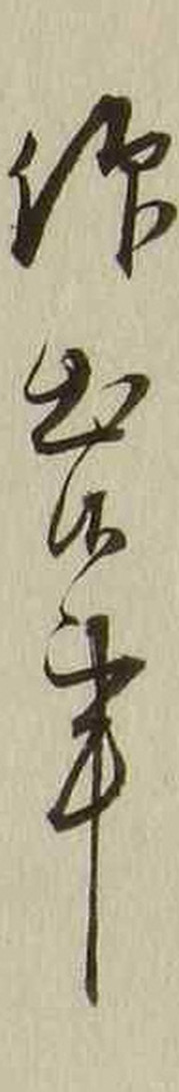仰出候事
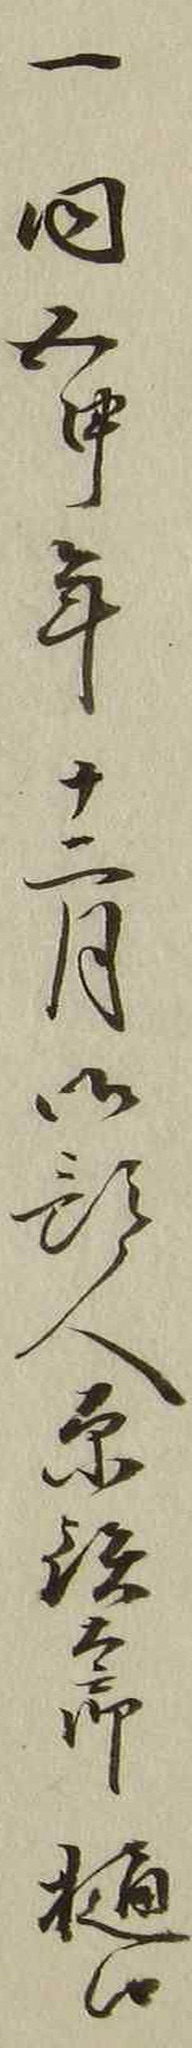一同五申年十二月御預人原鉄太郎樋口
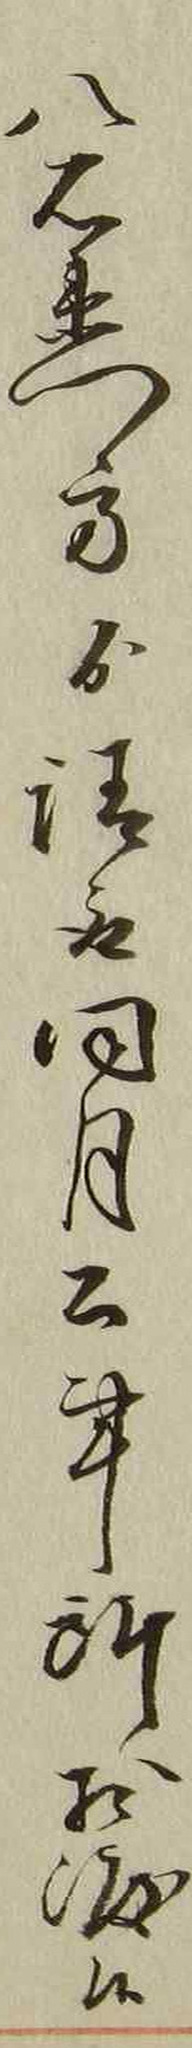八右衛門方ゟ請取同月公事所へ相渡候
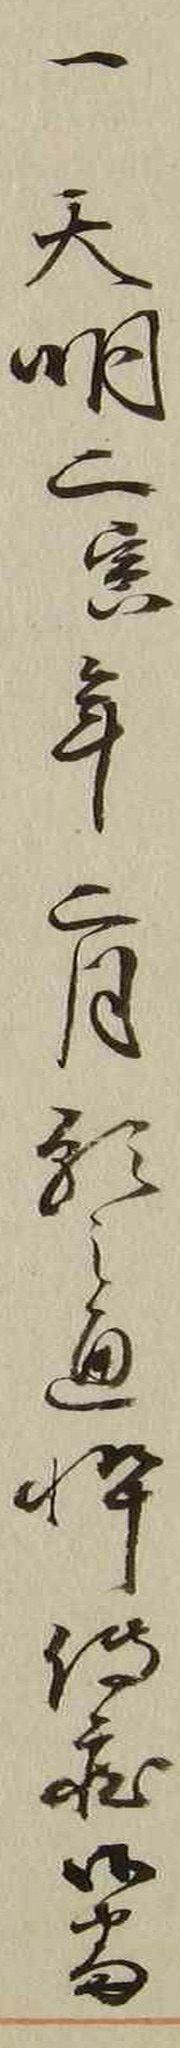一天明二寅年二月願之通忰伝蔵御番
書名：諸士系譜　巻之122　よ之部5
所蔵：会津若松市立会津図書館
